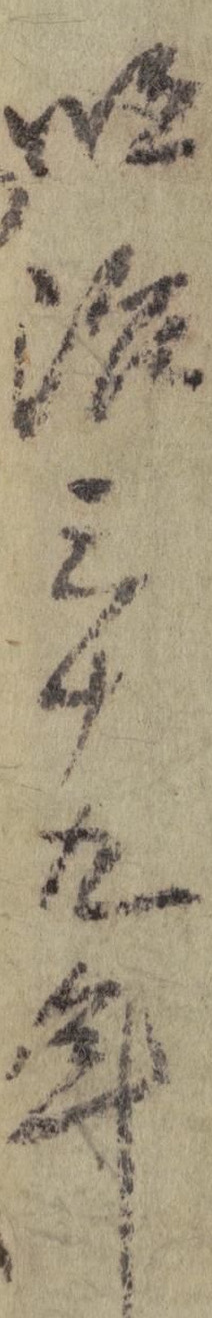明治三十九年
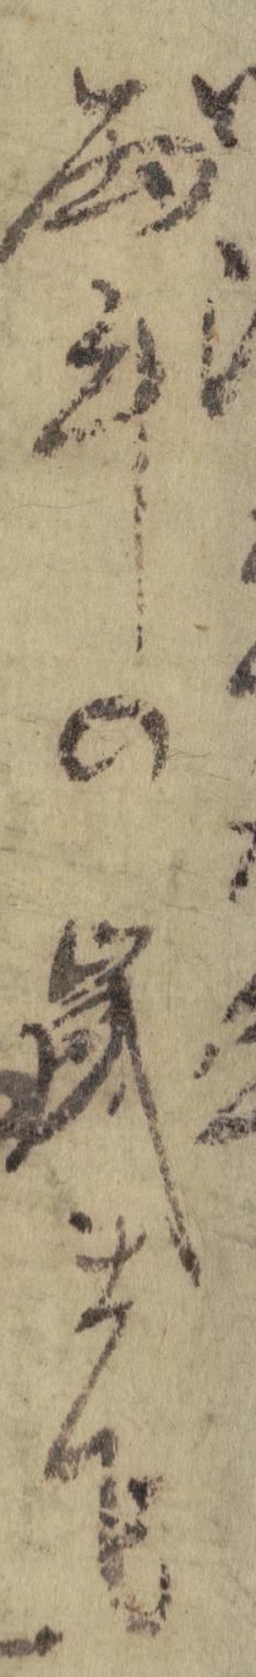両年の歳まで
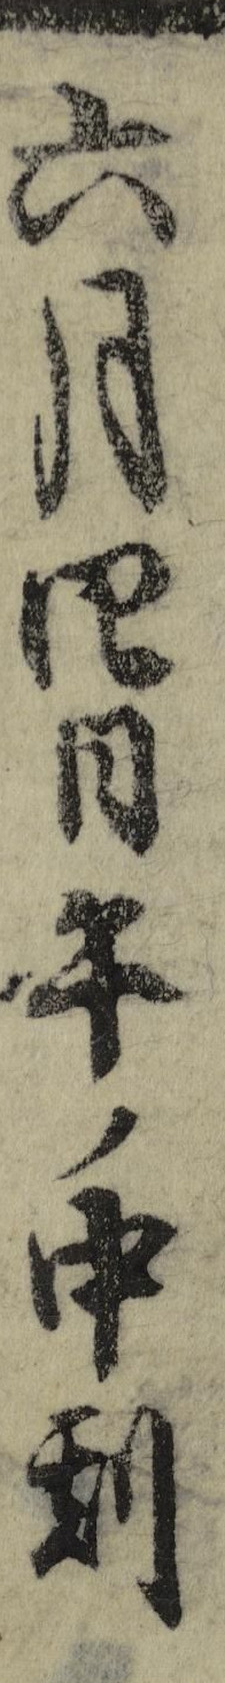六月四日午ノ中刻
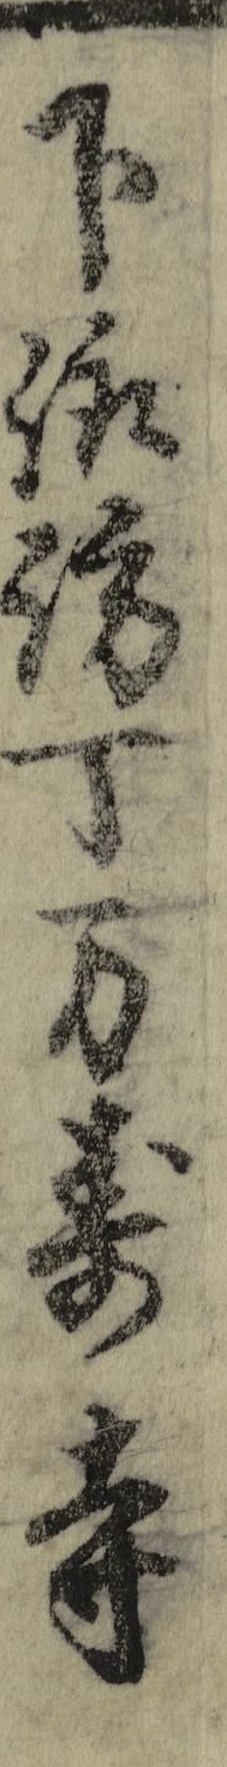下諏訪丁万寿寺
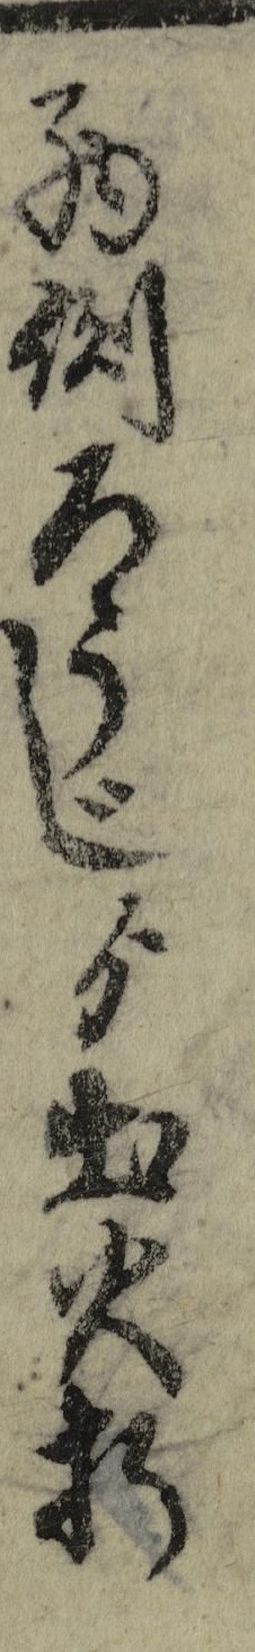西側かうじゟ出火折
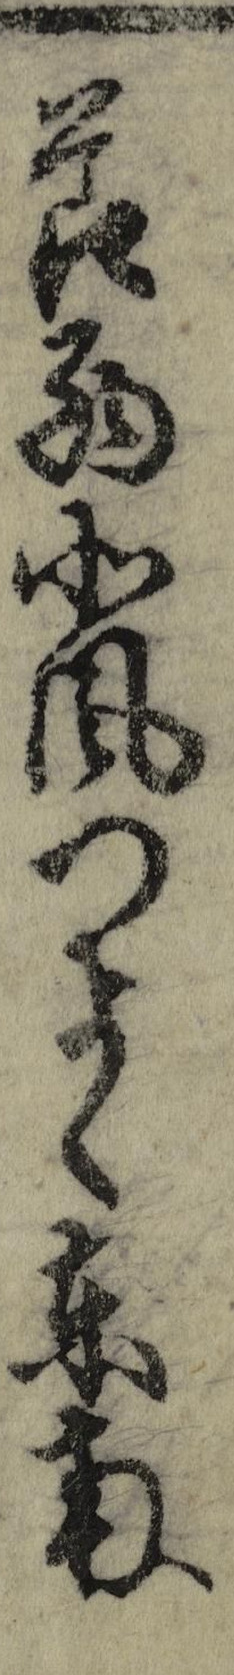節西北風つよく東南ヘ
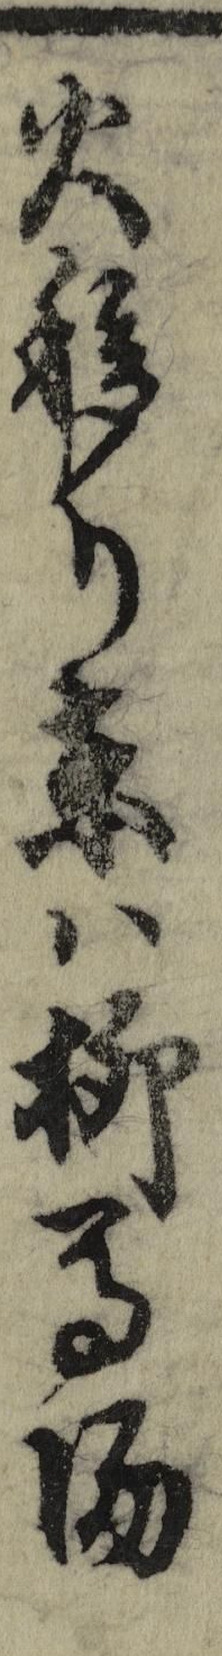火移り東は柳馬場
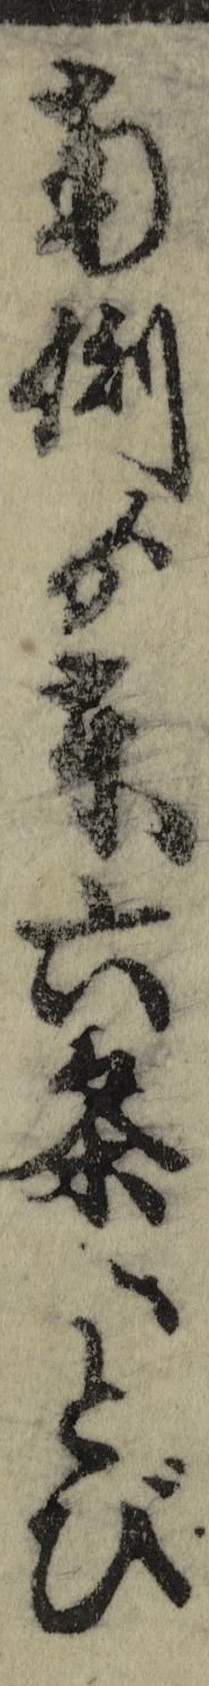南側ゟ東六条ヘとび
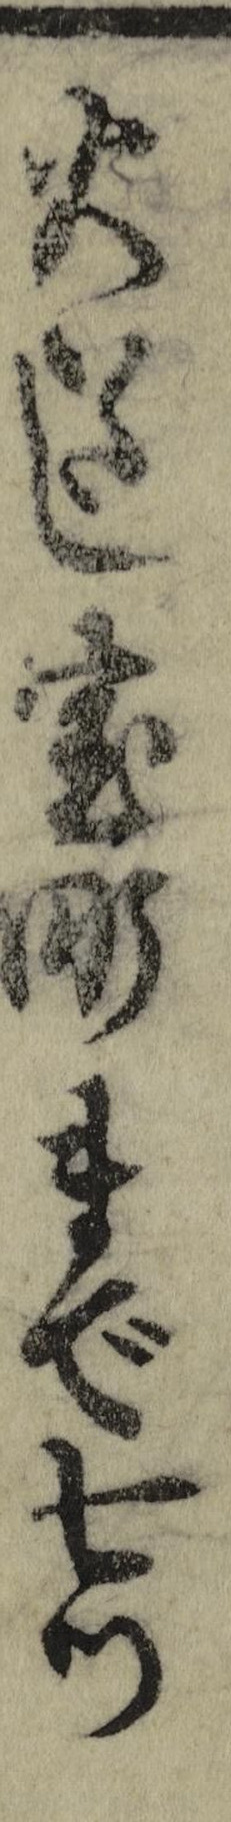火いたし室町まで七つ
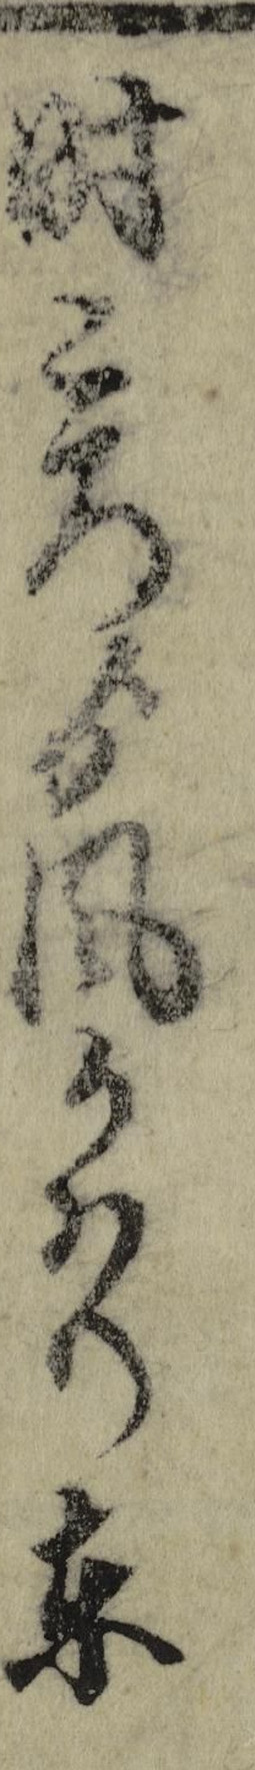時ころゟ風かはり東
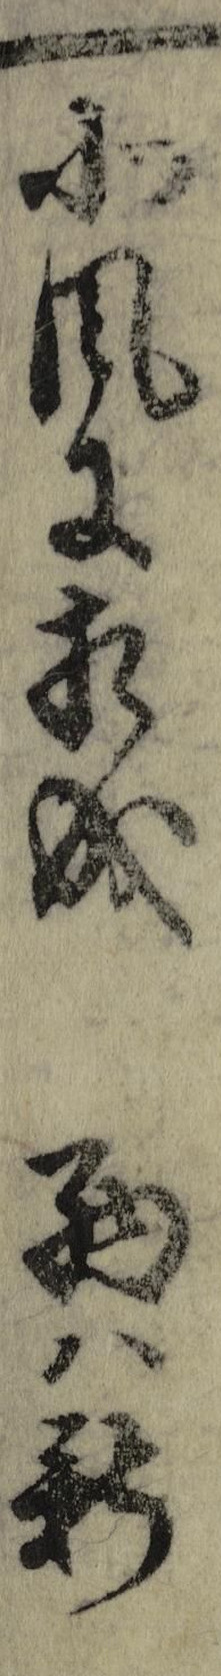北風に相成西は新
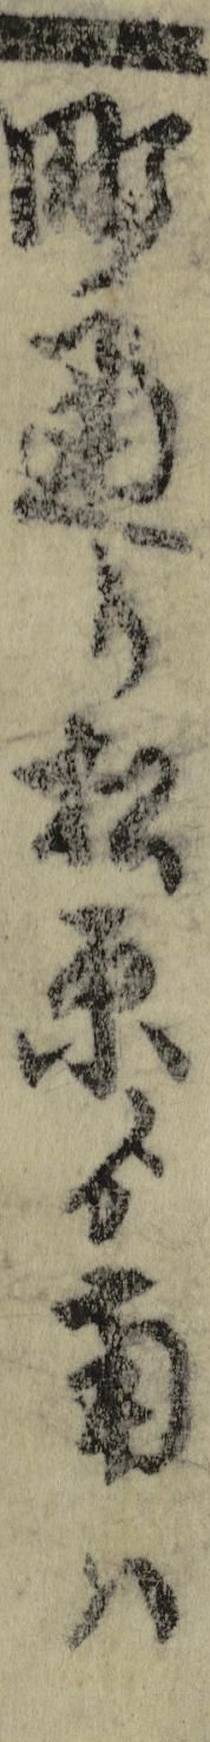町通り松原ゟ南は
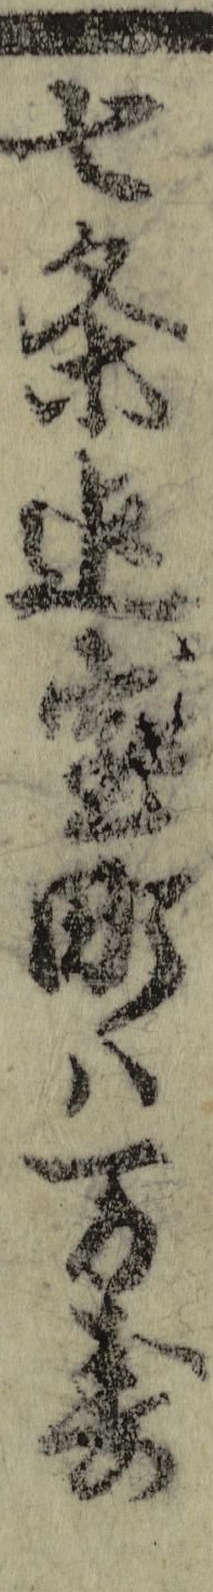七条迠室町は万寿
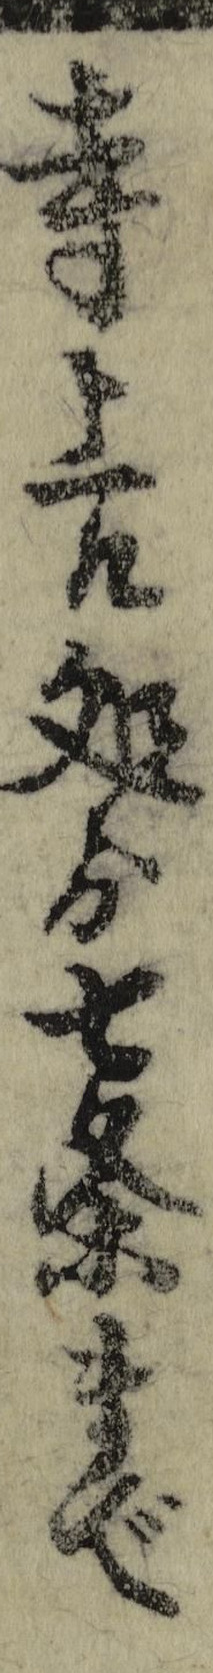寺上ル処ゟ七条まで
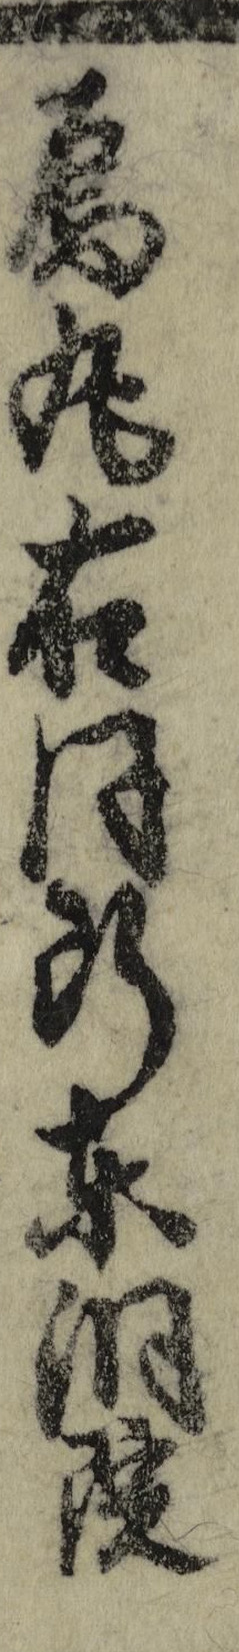烏丸右同断東洞院
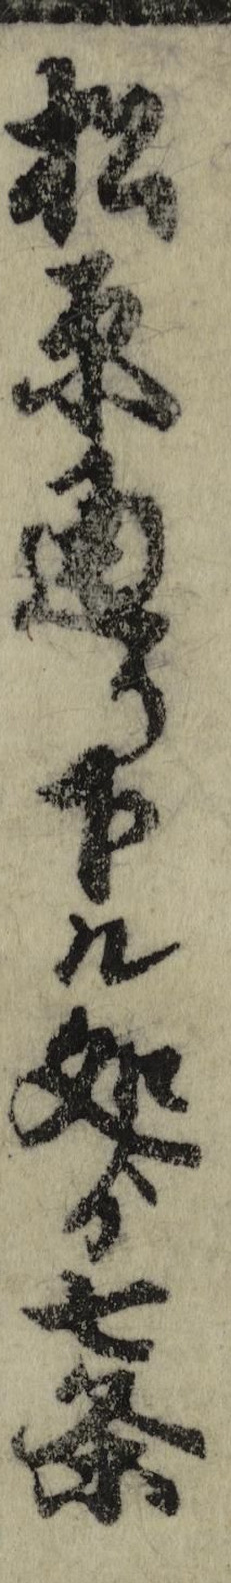松原通り下ル処ゟ七条
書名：京都大火極本しらべ
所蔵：東京大学地震研究所図書室 Earthquake Research Institute Library, The University of Tokyo, JAPAN
